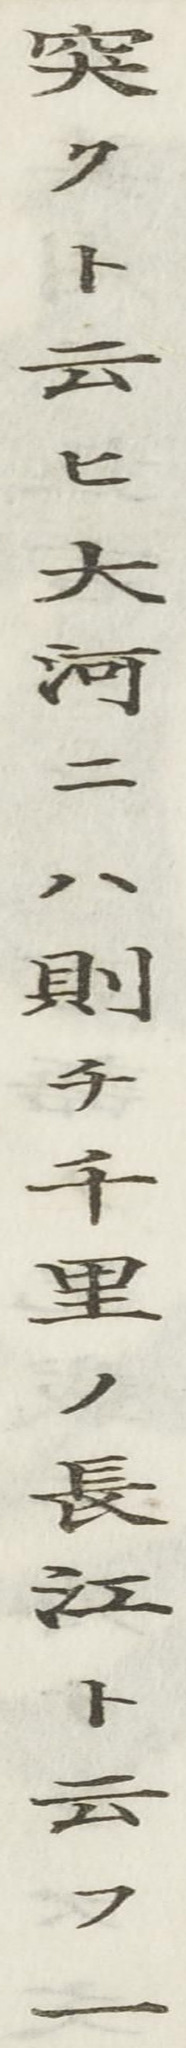突クト云ヒ大河ニハ則チ千里ノ長江ト云フ一
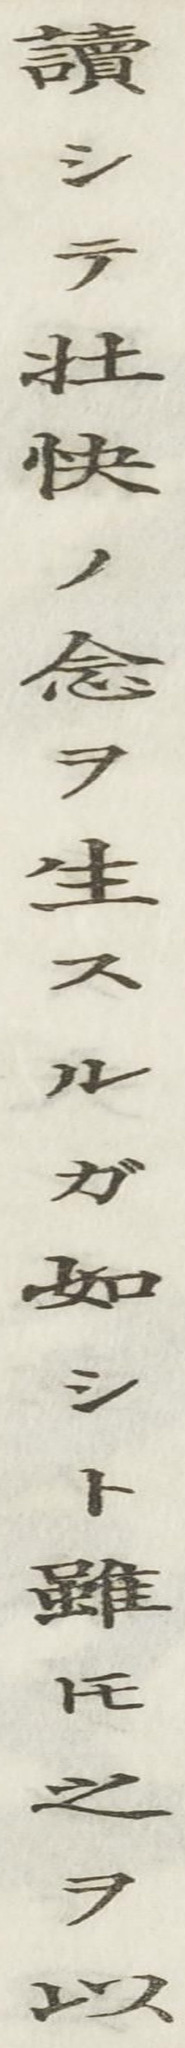読シテ壮快ノ念ヲ生スルガ如シト雖モ之ヲ以
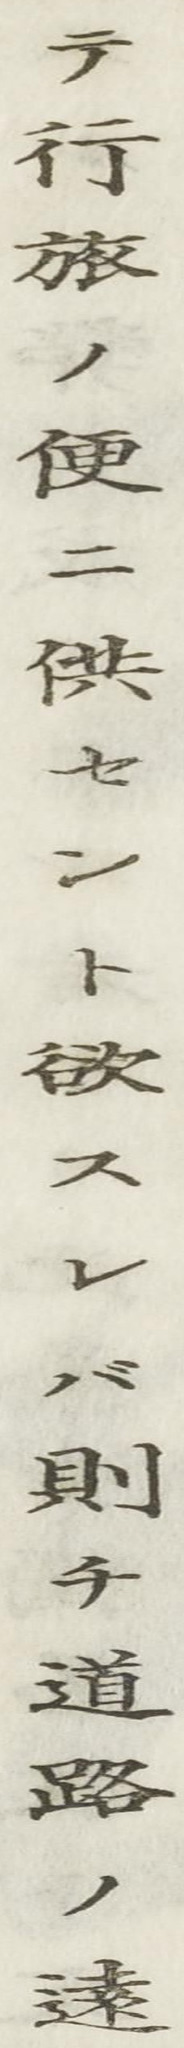テ行旅ノ便ニ供セント欲スレバ則チ道路ノ遠
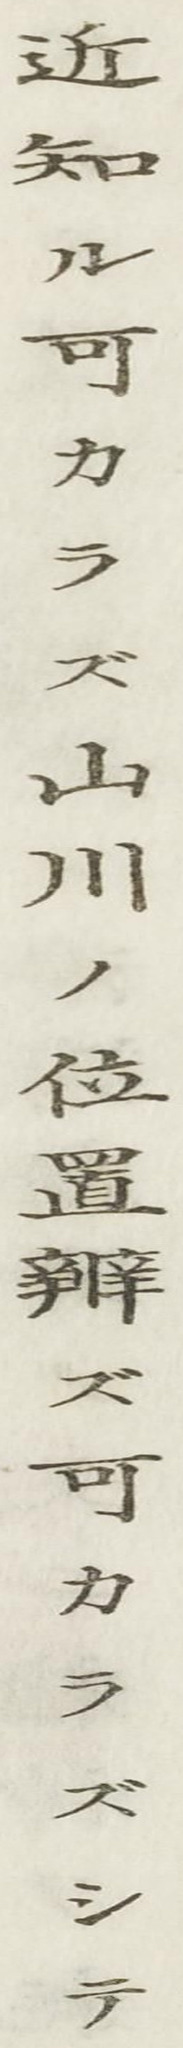近知ル可カラズ山川ノ位置弁ズ可カラズシテ
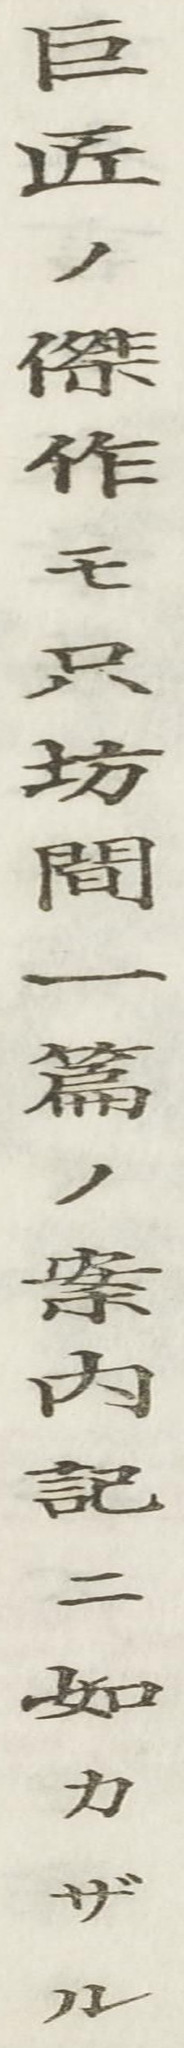巨匠ノ傑作モ只坊間一篇ノ案内記ニ如カザル
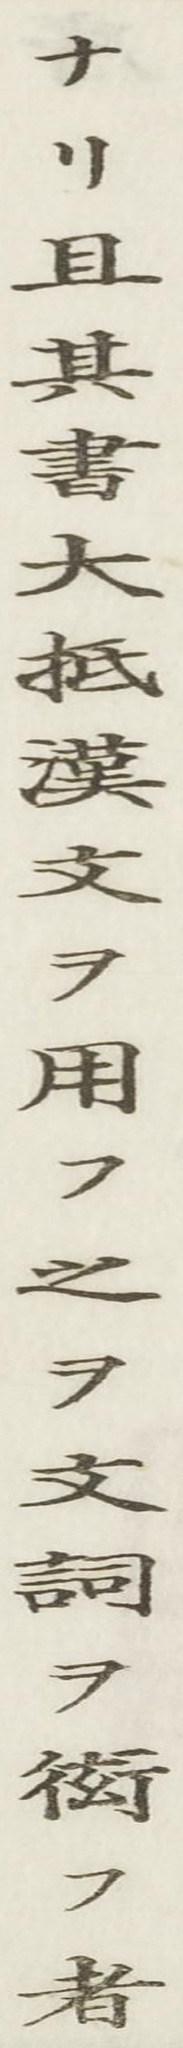ナリ且其書大抵漢文ヲ用フ之ヲ文詞ヲ衒フ者
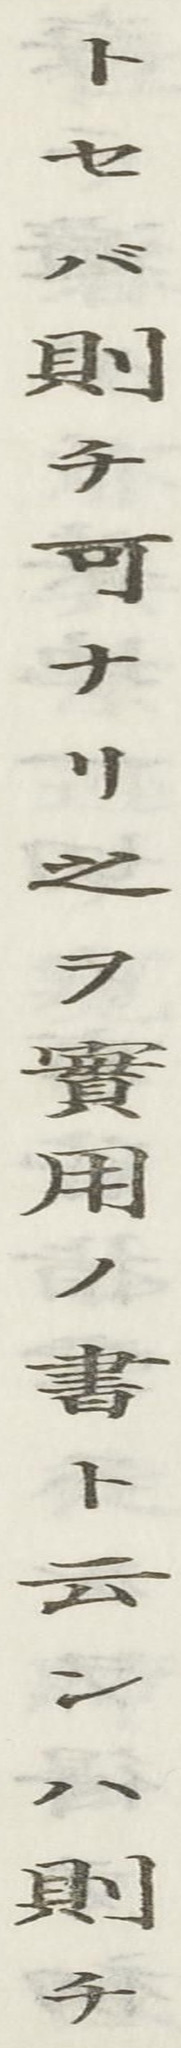トセバ則チ可ナリ之ヲ実用ノ書ト云ンハ則チ
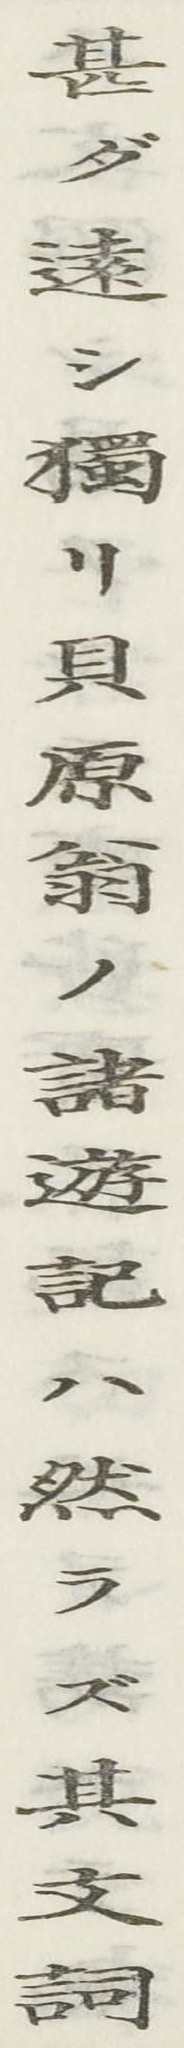甚ダ遠シ獨リ貝原翁ノ諸遊記ハ然ラズ其文詞
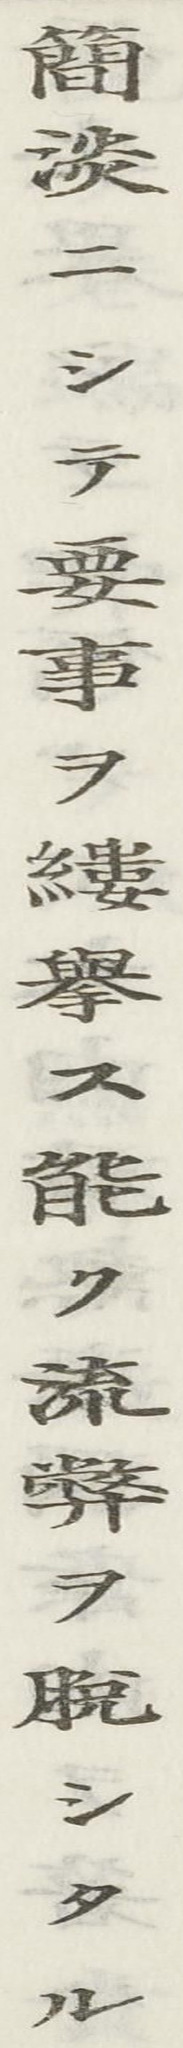簡淡ニシテ要事ヲ縷挙ス能ク流弊ヲ脱シタル
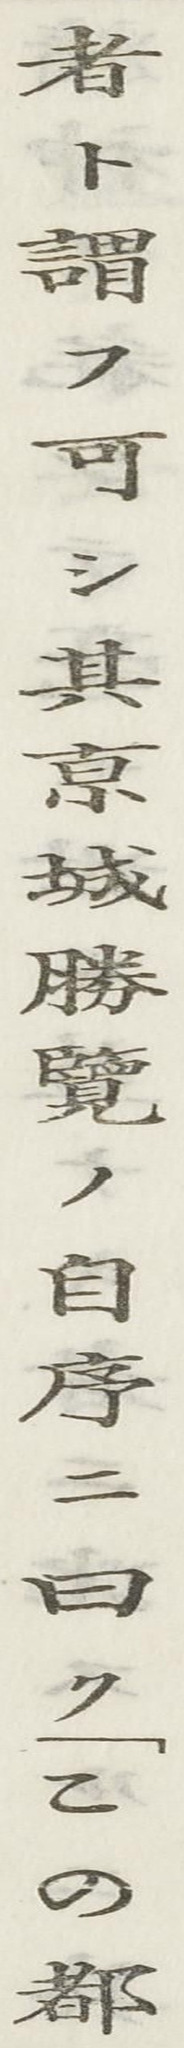者ト謂フ可シ其亰城勝覧ノ自序ニ曰ク「この都
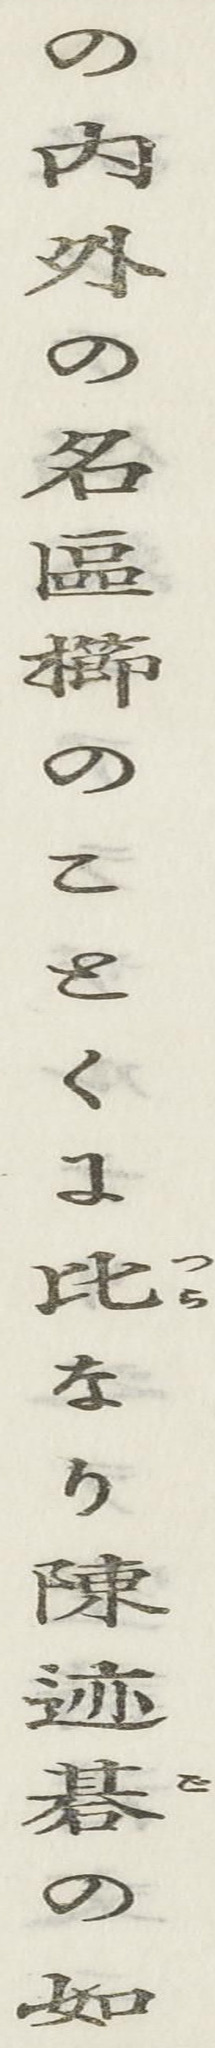の内外の名區櫛のことくに比なり陳述碁の如
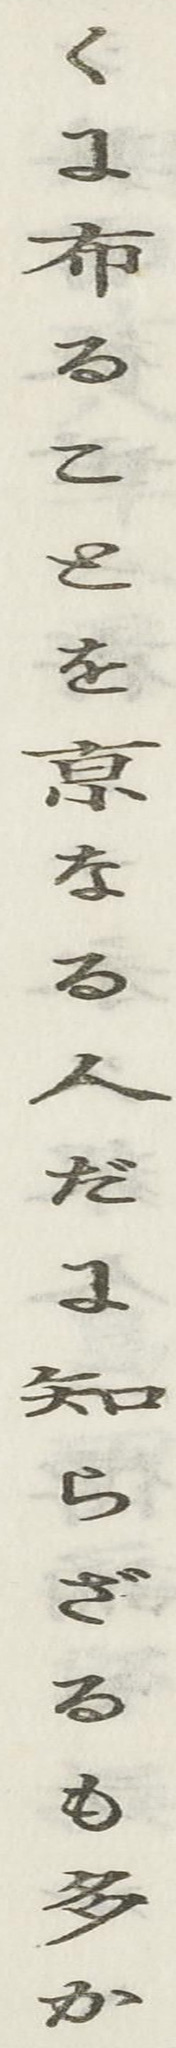くに布ることを亰なる人だに知らざるも多か
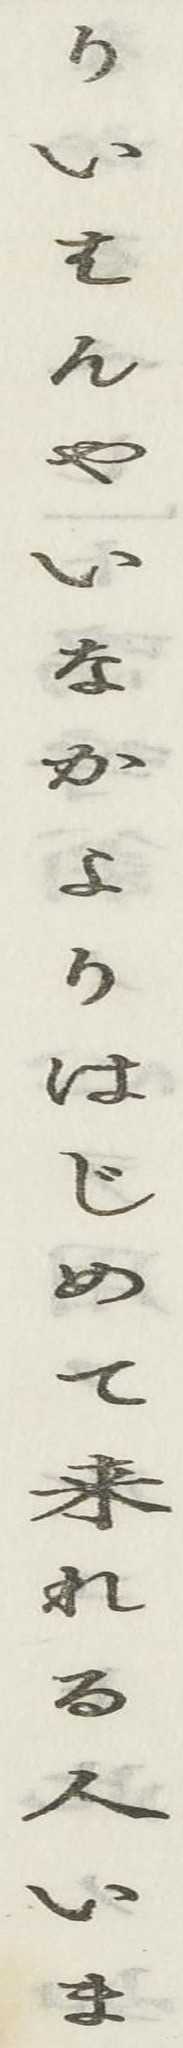りいはんやいなかよりはじめて来れるひといま
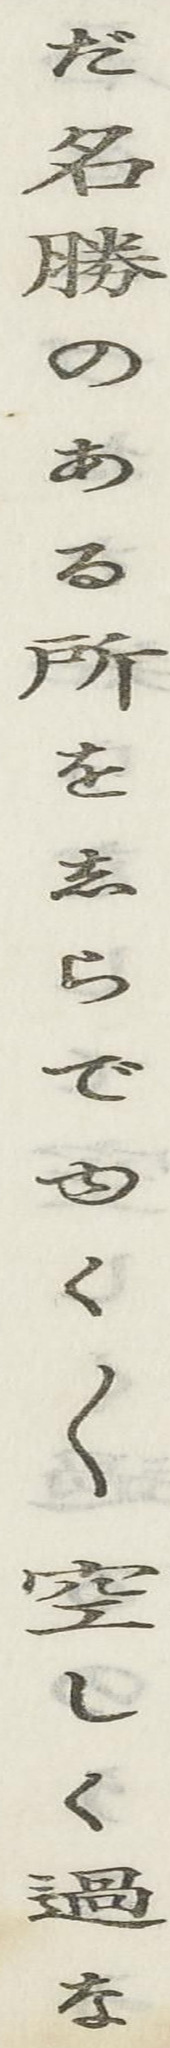だ名勝のある所をしらでゆく〳〵空しく過な
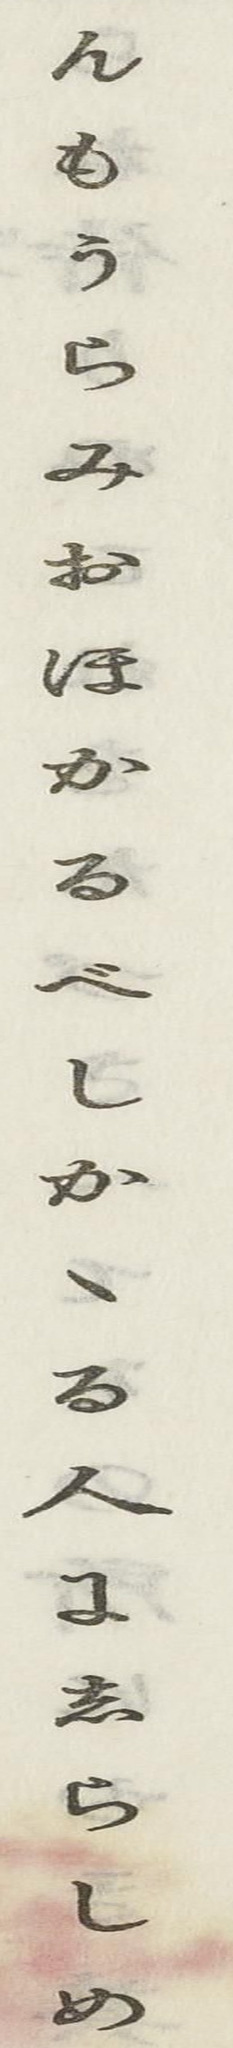んもうらみおほかるべしかゝる人にしらしめ
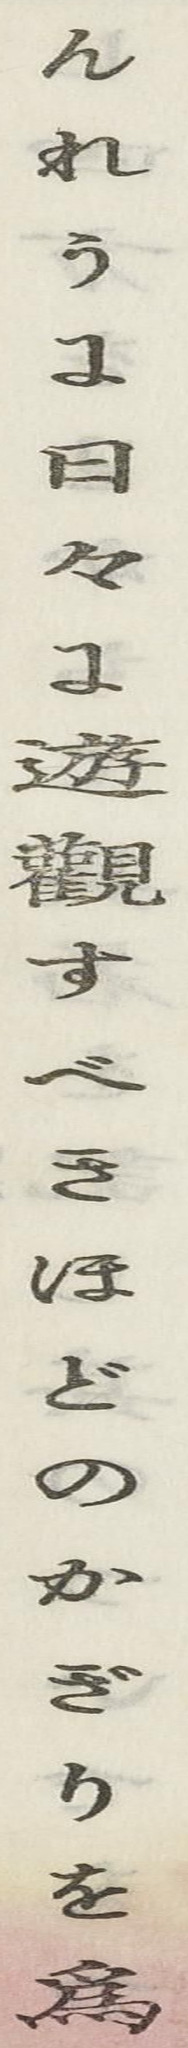んれうに日々に遊観すべきほどのかぎりを為
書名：熱海獨案内　全
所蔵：東京大学地震研究所図書室 Earthquake Research Institute Library, The University of Tokyo, JAPAN
